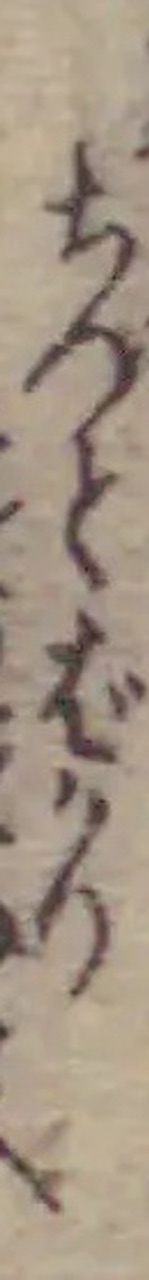ちつとばかり
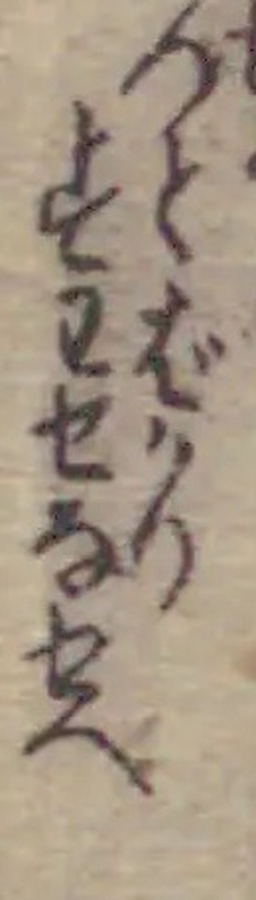すわせなせへ

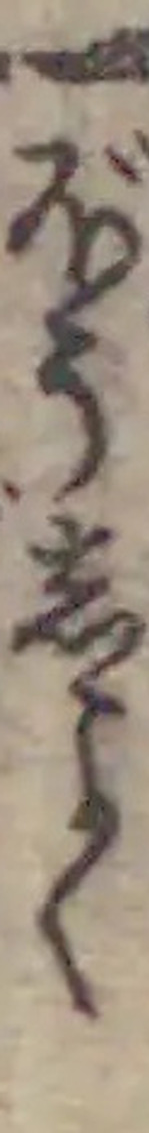ぼうしよく
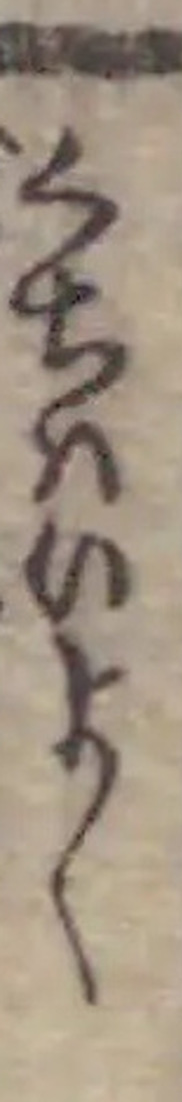くちはいよ〳〵
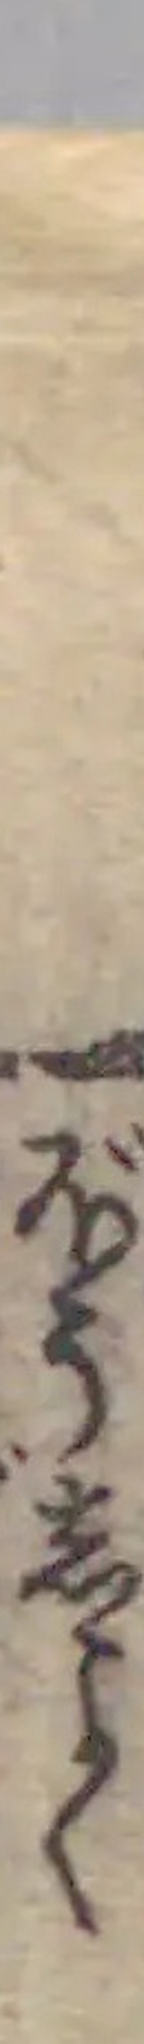ぼうしよく
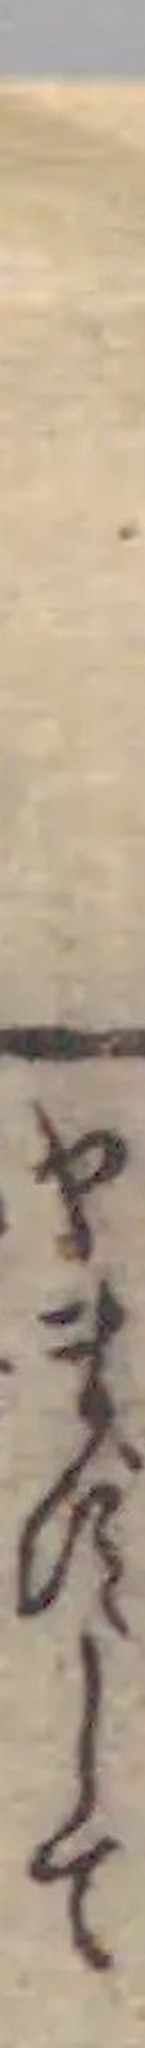やまずして
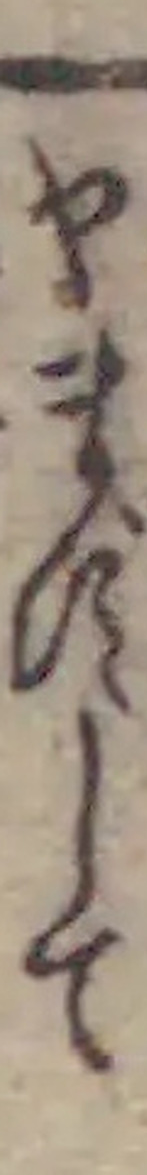やまずして
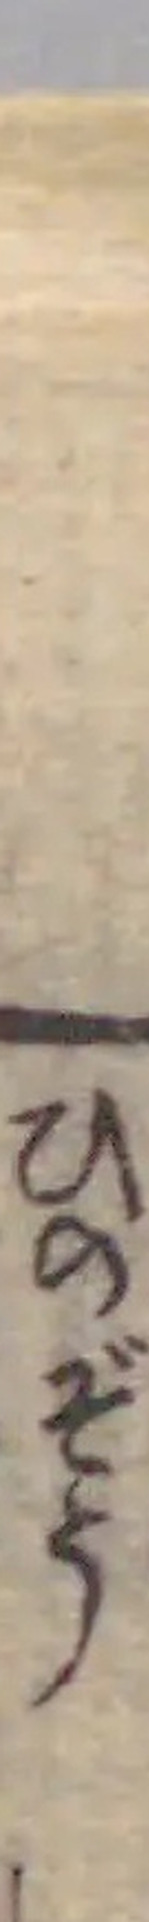ひのぞう
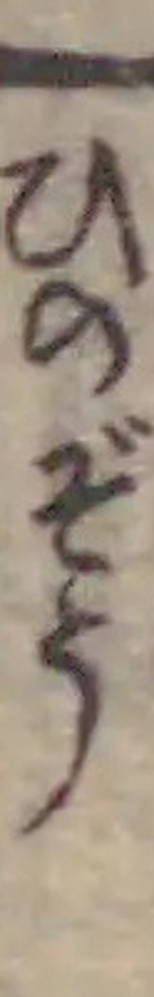ひのぞう
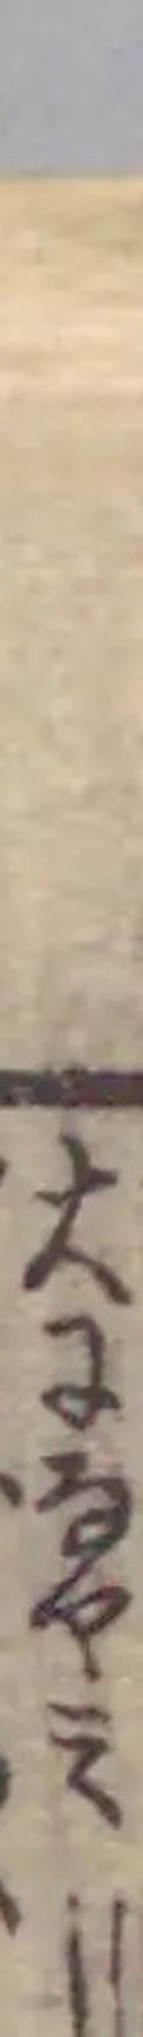大になやみ
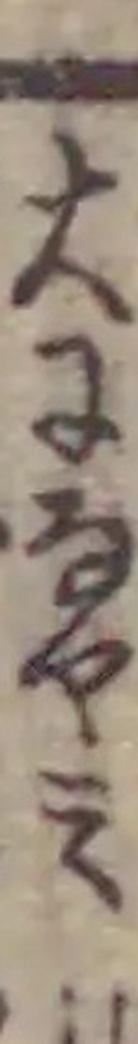大になやみ
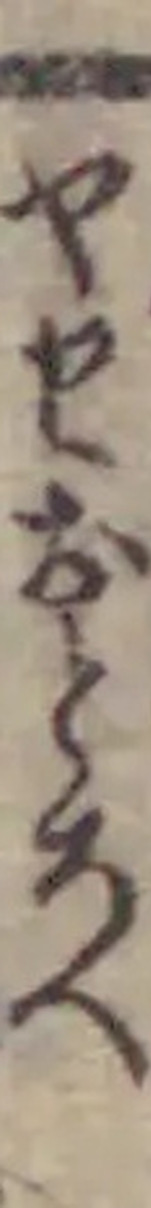やせおとろへ
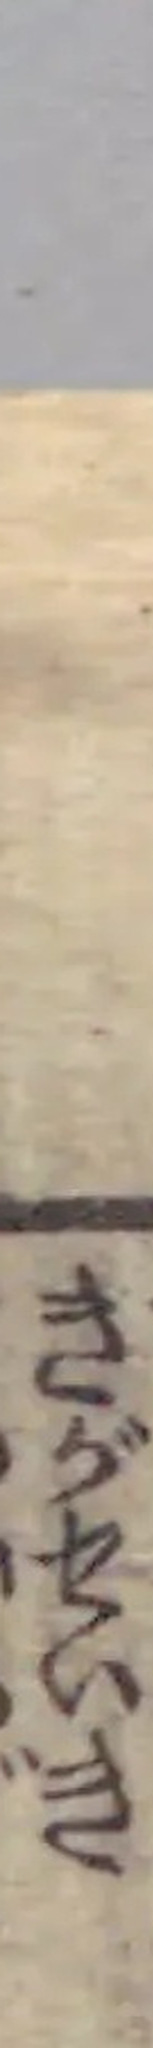きがせいき
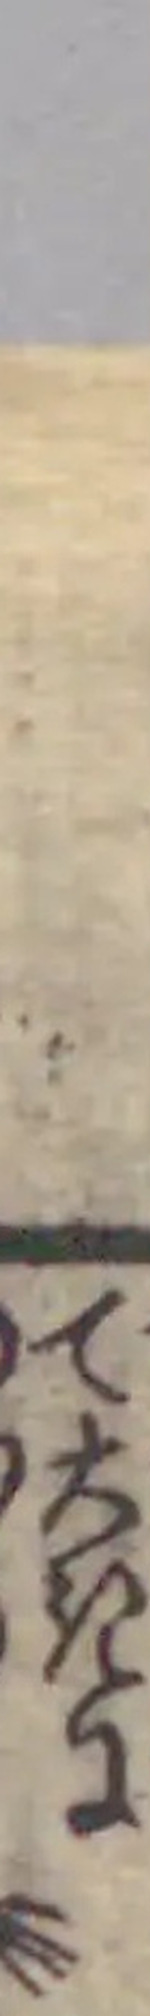て大きに
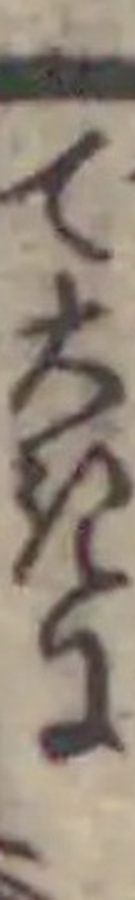て大きに
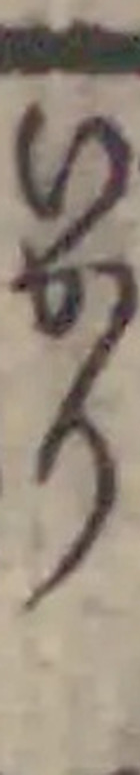いかり
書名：腹内養生主論 3巻
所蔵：国立国会図書館 National Diet Library, JAPAN
